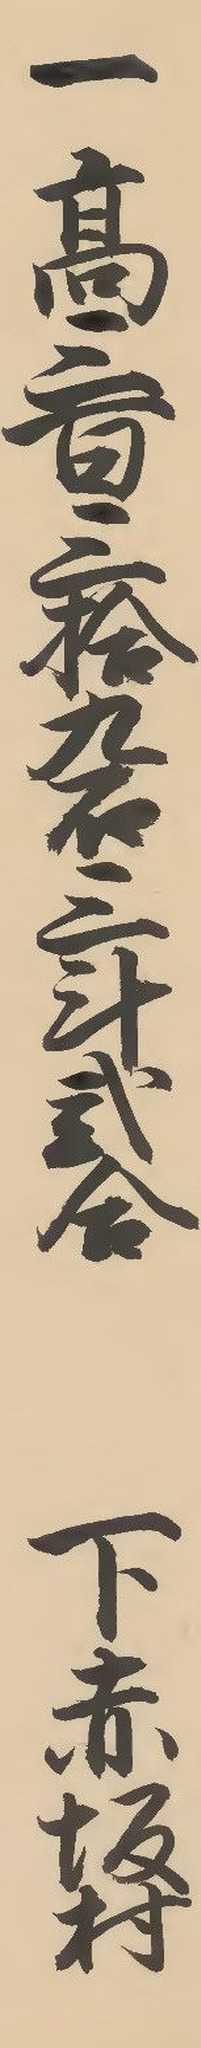一高三百三拾九石三斗弐合下赤坂村
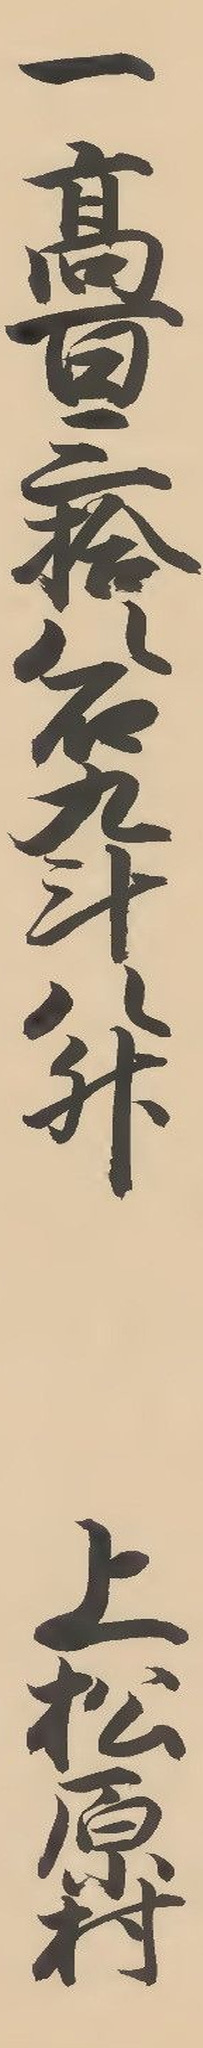一高百三拾八石九斗八升上松原村
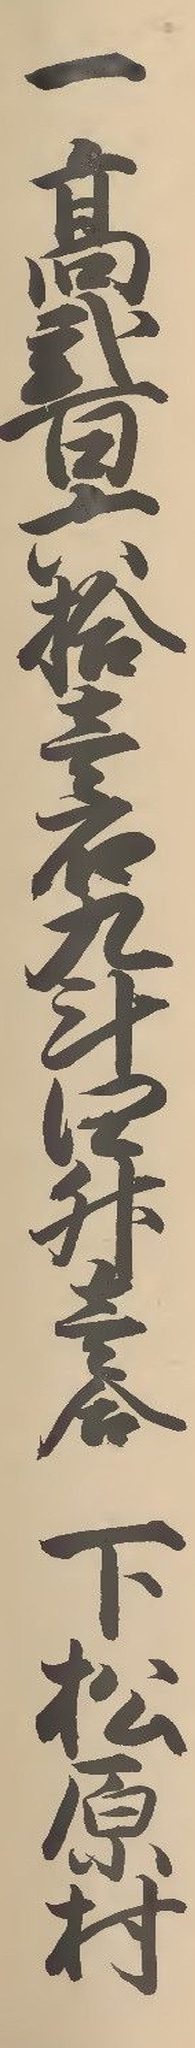一高弐百六拾壱石九斗四升壱合下松原村
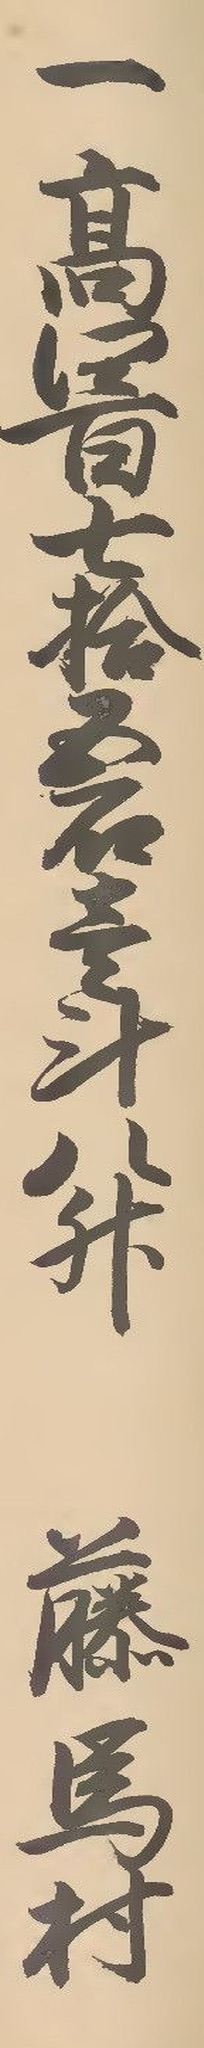一高四百七拾五石壱斗八升藤馬村
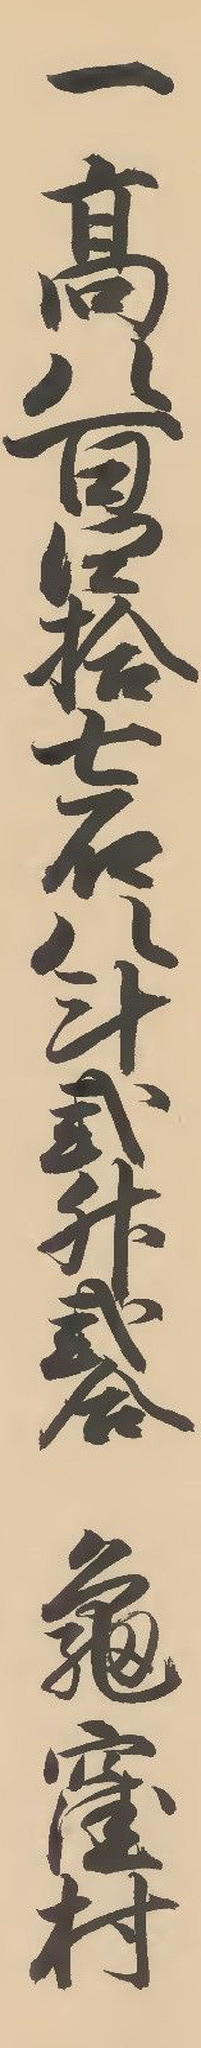一高八百四拾七石八斗弐升弐合亀窪村
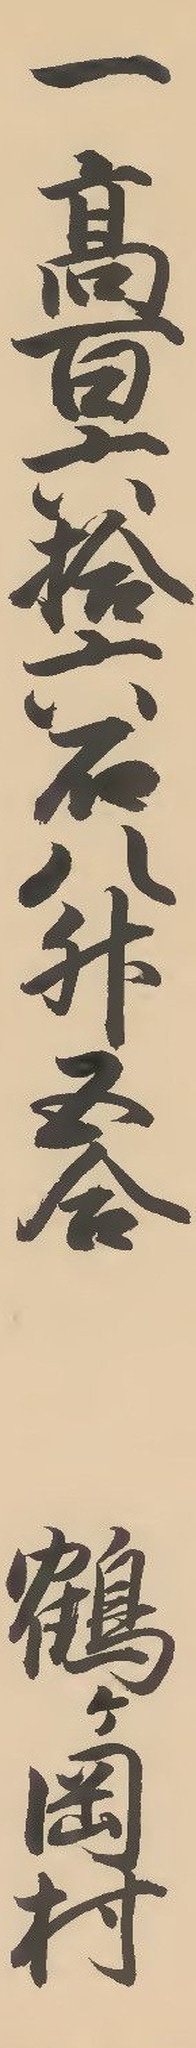一高百六拾六石八升五合鶴ヶ岡村
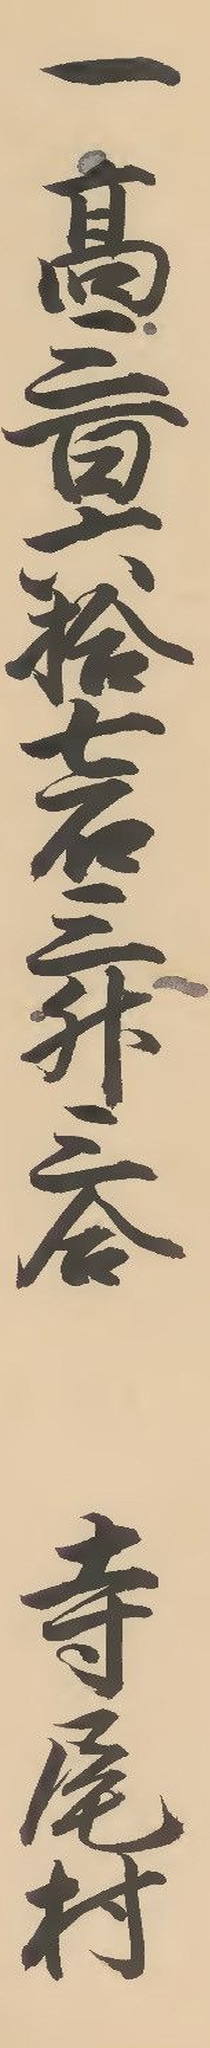一高三百六拾七石三升三合寺尾村

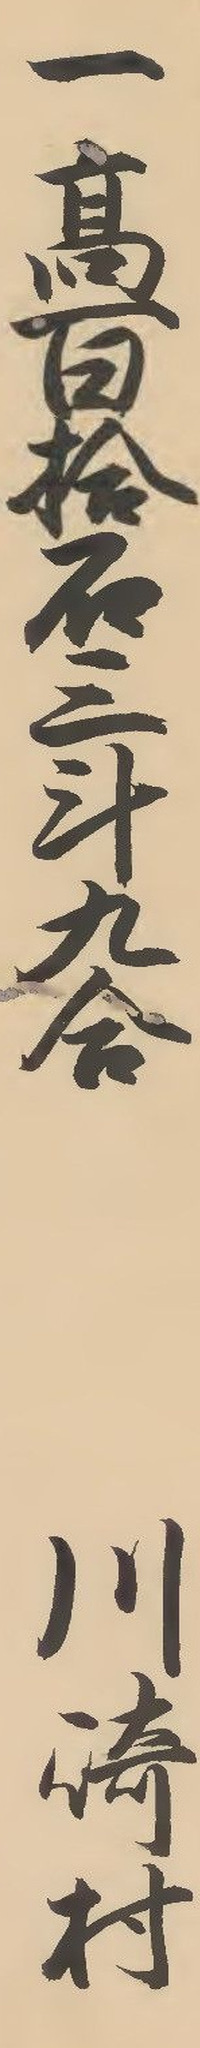一高百拾石三斗九合川崎村
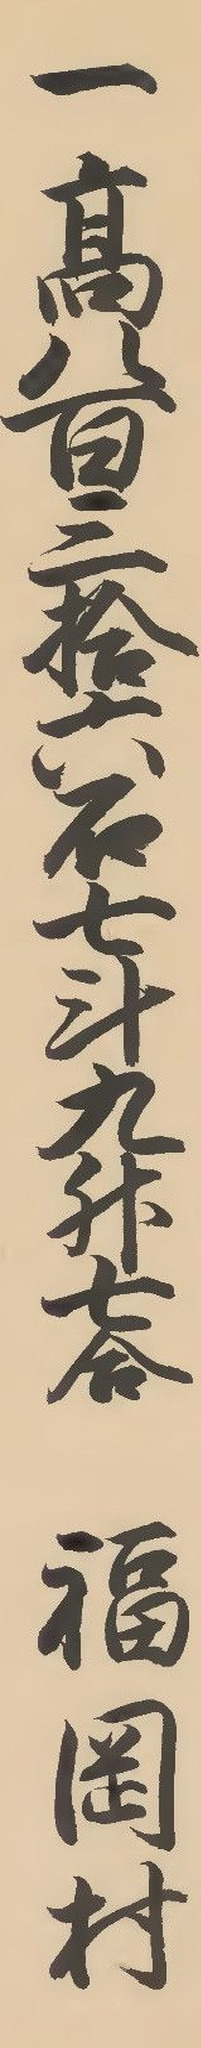一高八百三拾六石七斗九升七合福岡村
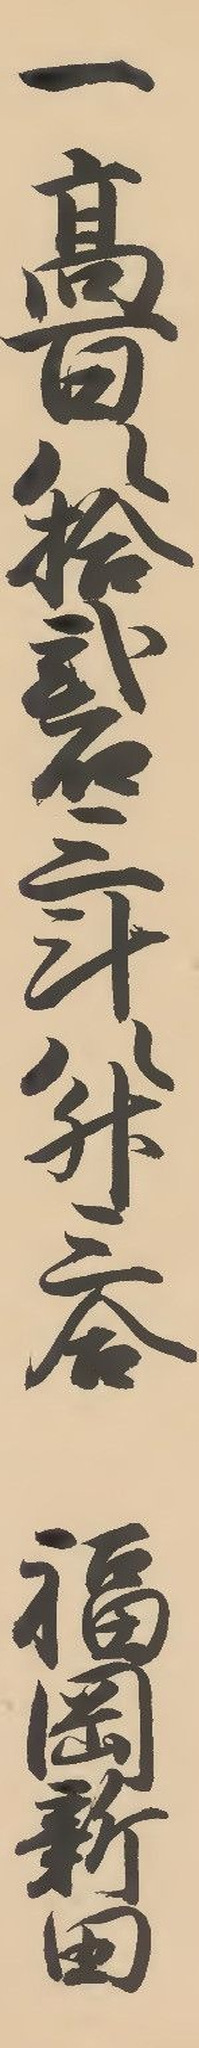一高百八拾弐石三斗升八三合福岡新田
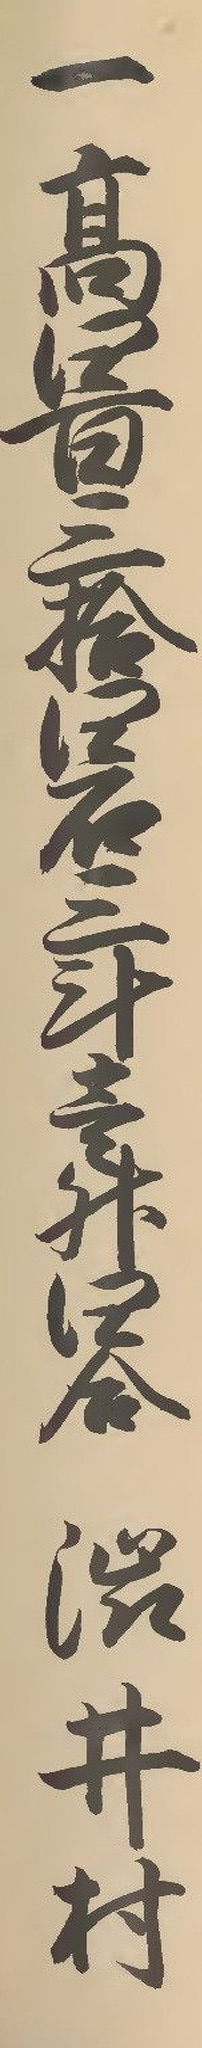一高四百三拾四石三斗壱升四合渋井村
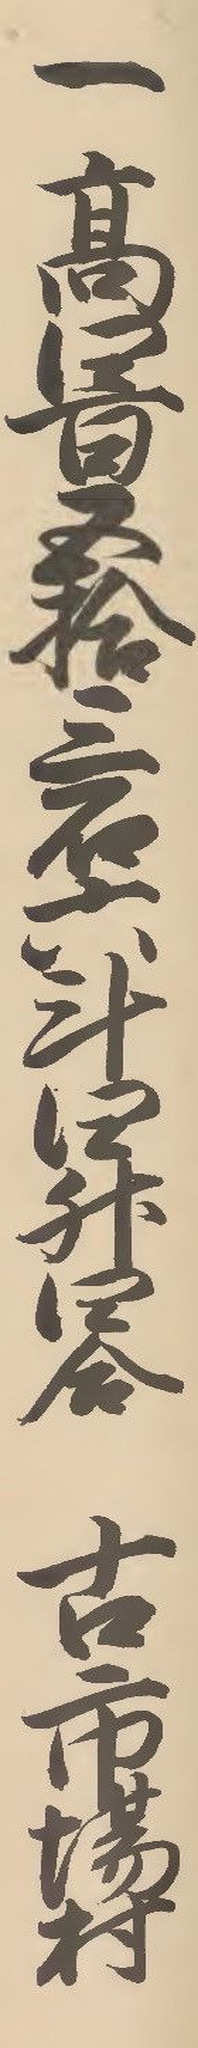一高四百五拾三石六斗四升四合古市場村
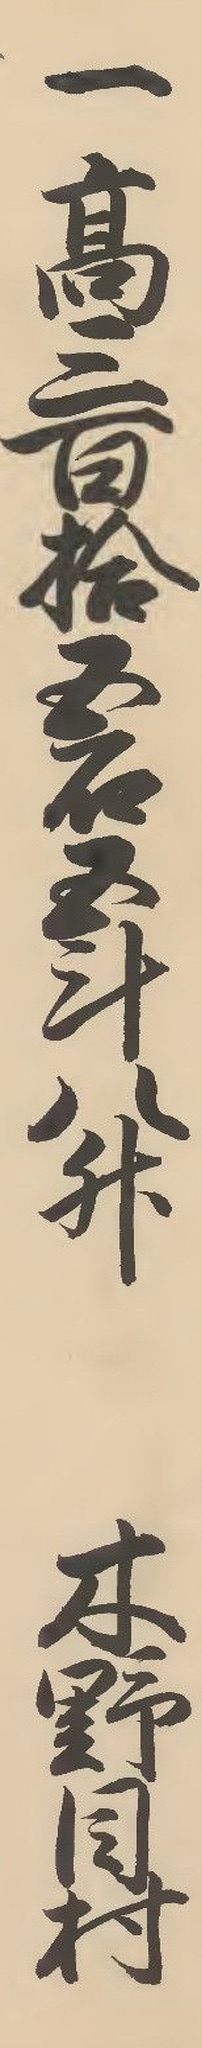一高三百拾五石五斗八升木野目村
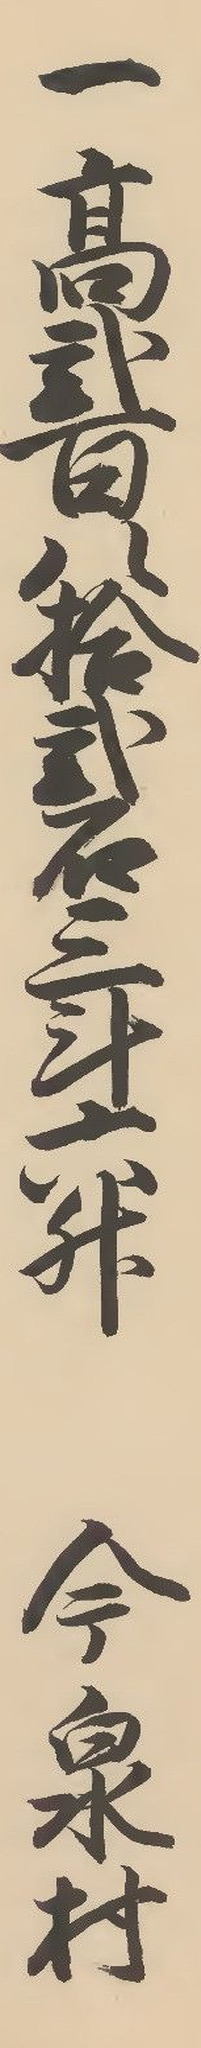一高弐百八拾弐石三斗六升今泉村
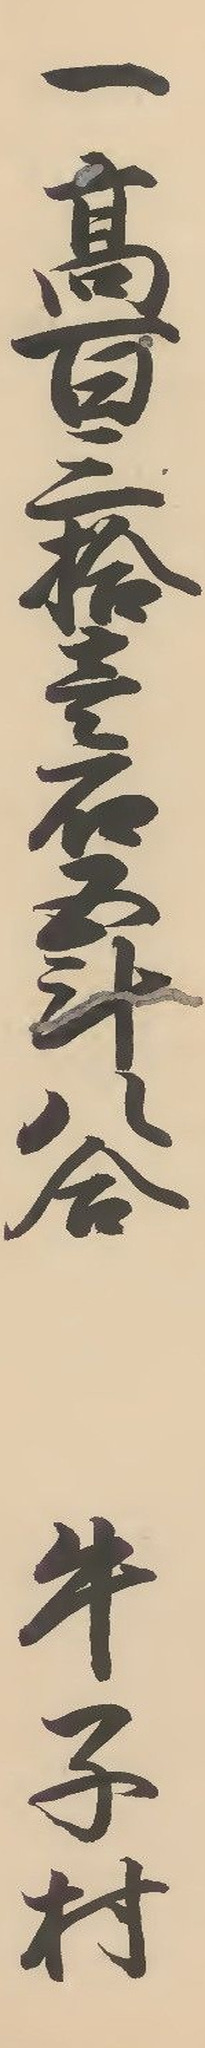一高百三拾壱石五斗八合牛子村

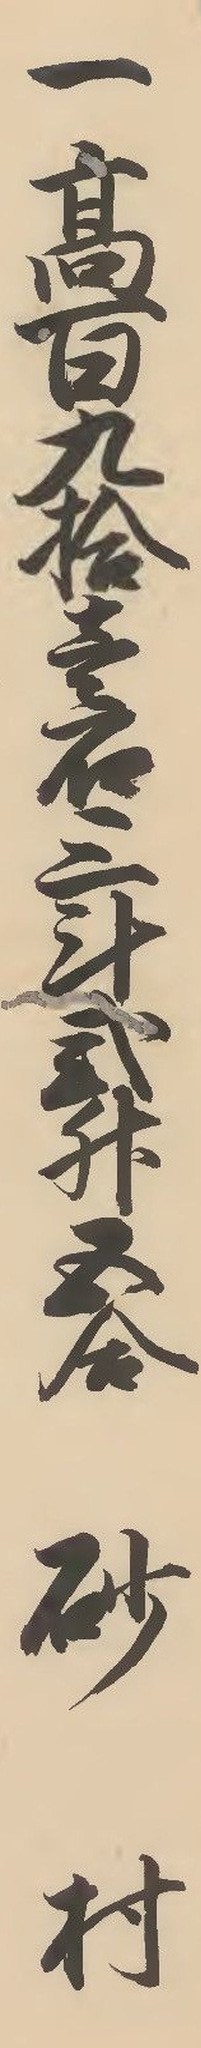一高百九拾壱石三斗弐升五合砂村
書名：武蔵国郷帳　上
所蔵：国立公文書館 National Archives of Japan
